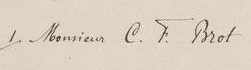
1) Monsieur C. F. Brot
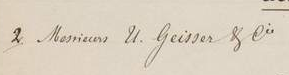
2) Messieurs U. Geisser & Cie
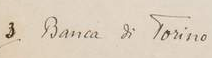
3) Banca di Torino
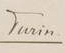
Turin.
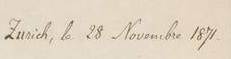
Zurich, le 28 Novembre 1871.
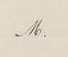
M.
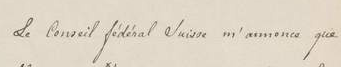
Le Conseil fédéral Suisse m'annonce que
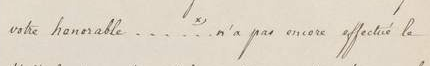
maison Banque n'a pas encore effectué le
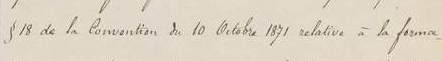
§ 18 de la Convention du 10 Octobre 1871 relative à la forma-
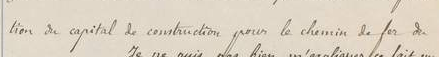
tion du capital de construction pour le chemin de fer du
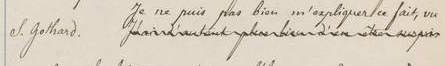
S. Gothard. J'ai d'autant plus bien d'en être surprisJe ne
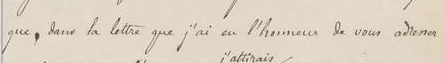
que, dans la lettre que j'ai eu l'honneur de vous adresser
